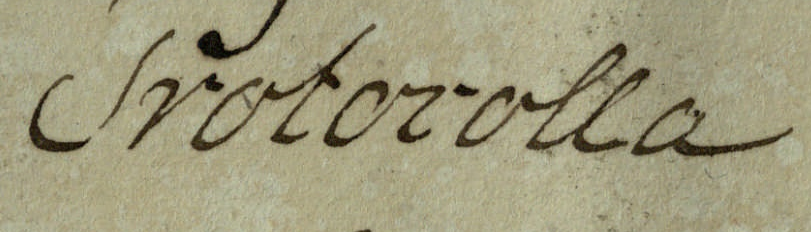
Protocolla
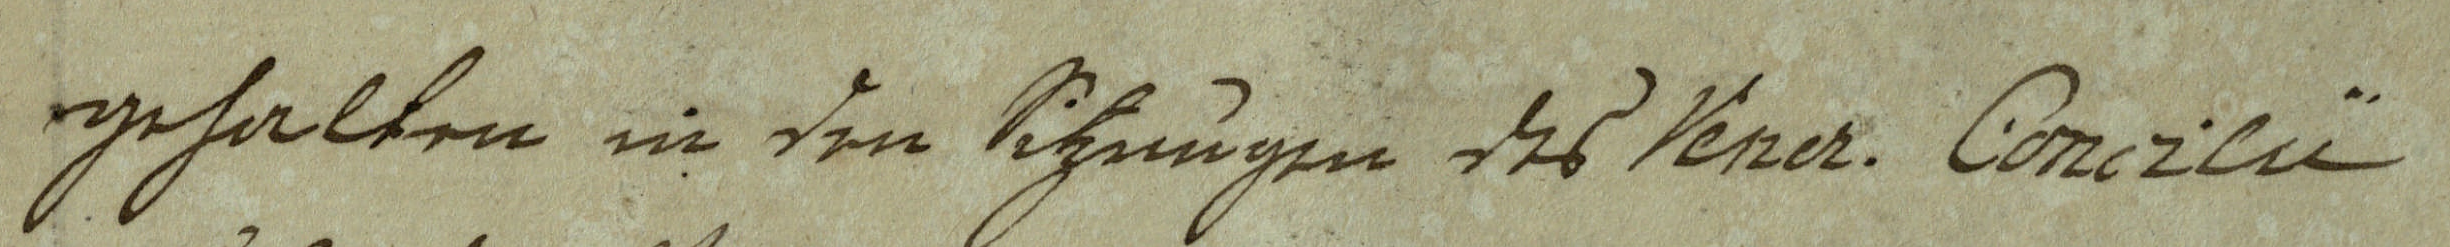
gehalten in den Sitzungen des Vener. Concilii
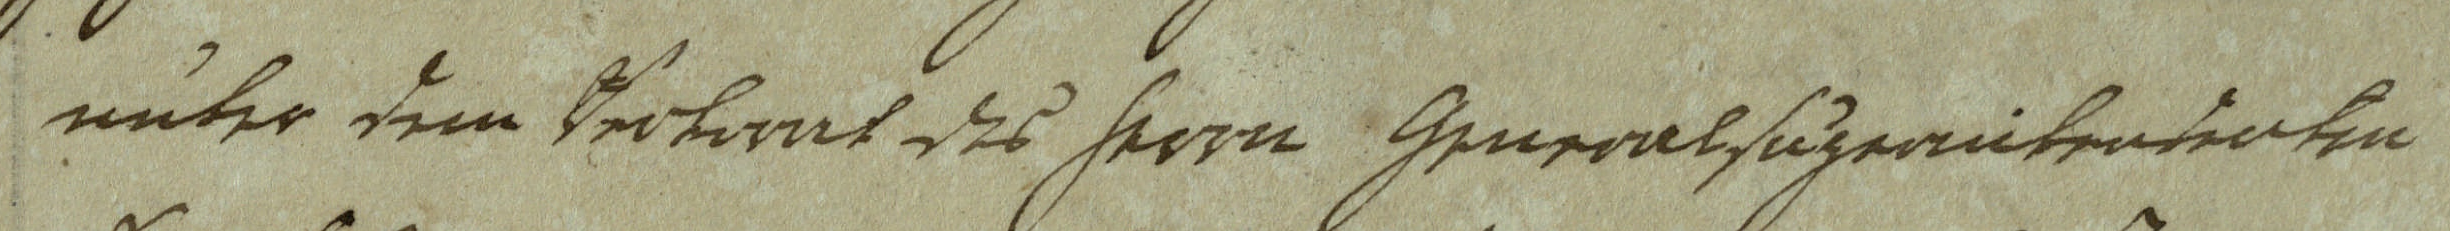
unter dem Rectorat des herrn Generalsuperintendenten
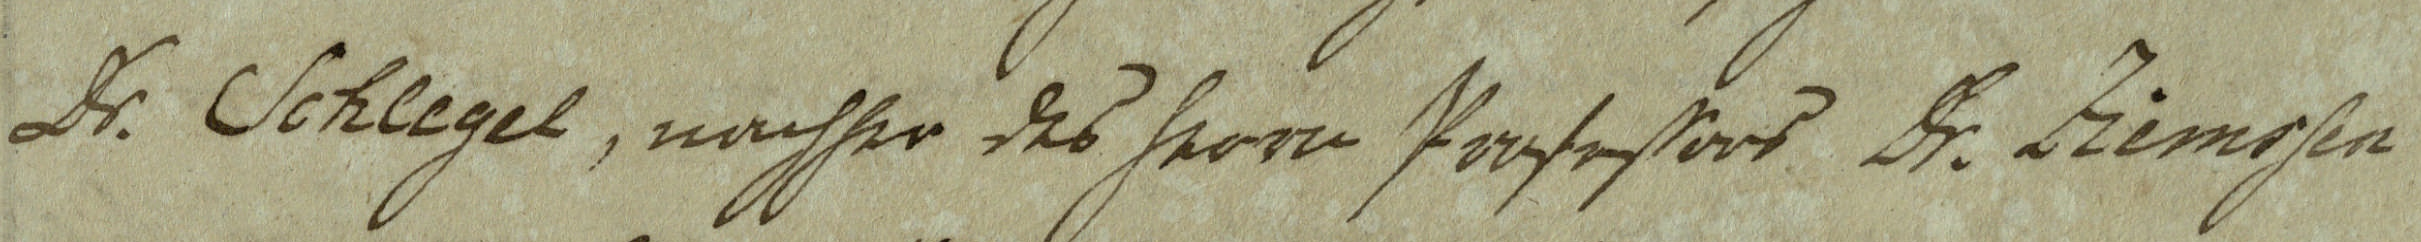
Dr. Schlegel, nachher des Herrn Professors Dr. Ziemssen
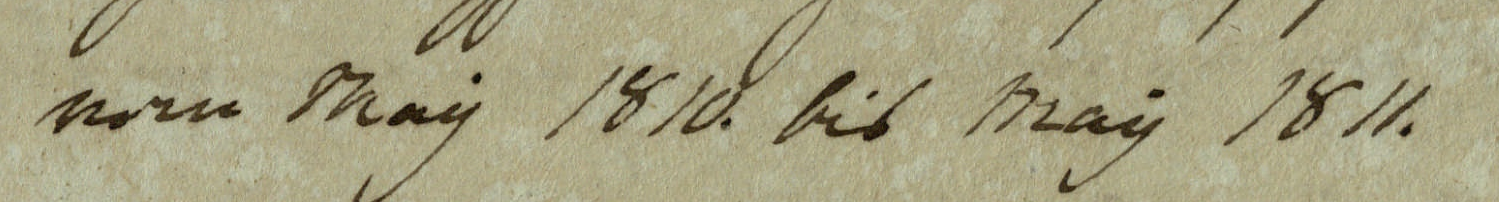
vom Maÿ 1810. bis Maÿ 1811.
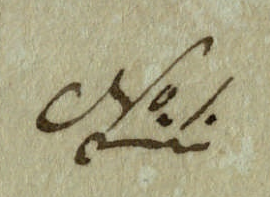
Nº.1.
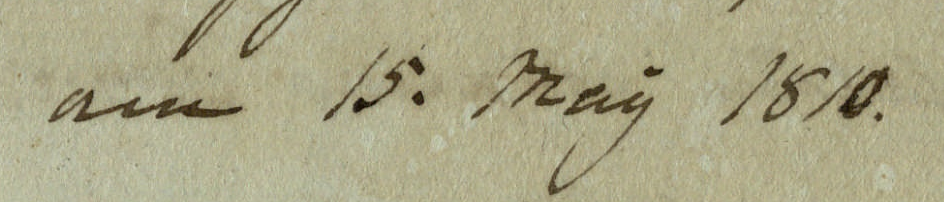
am 15. Maÿ 1810.
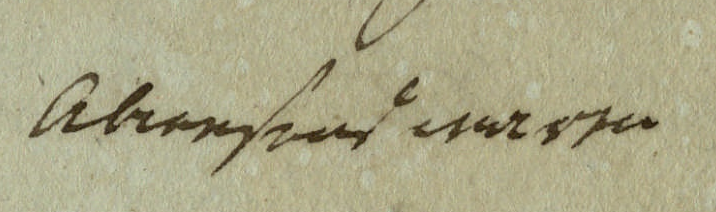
Abwesend waren
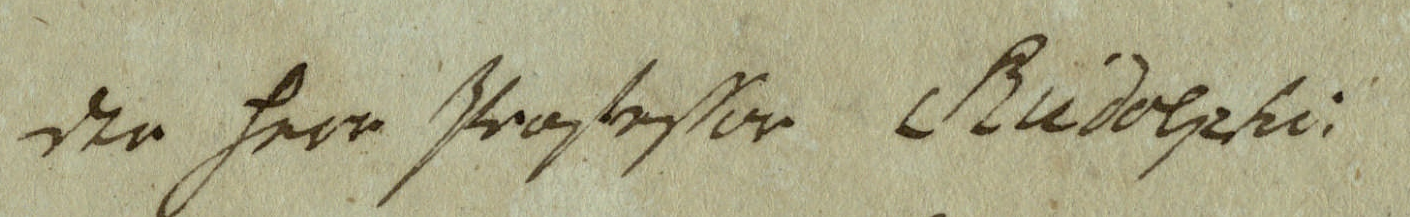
der herr Professor Rudolphi.
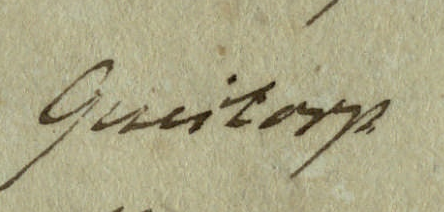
Quistorp.
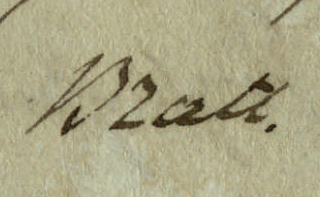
Bratt.
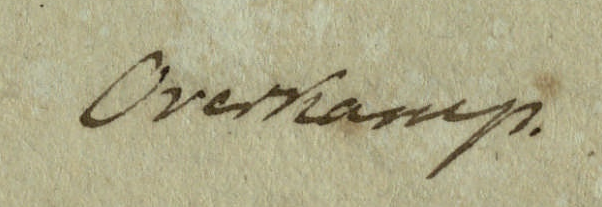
Overkamp.
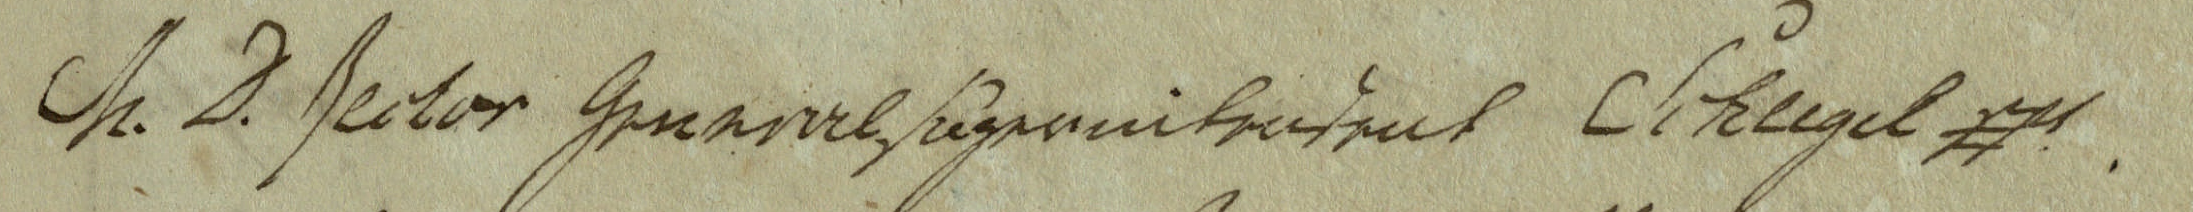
M. D. Rector Generalsuperintendent Schlegel ppt.
